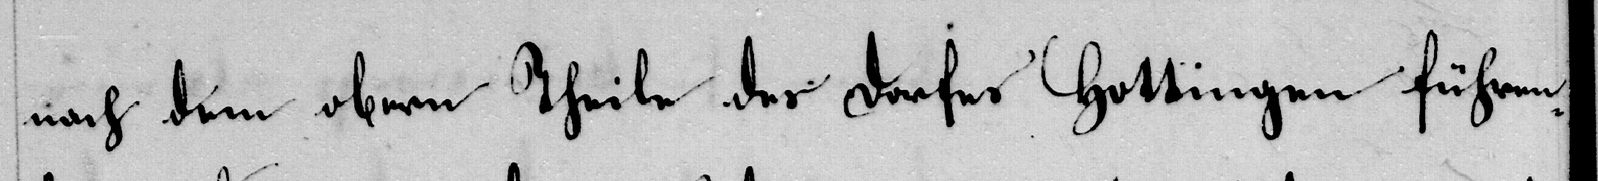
nach dem obern Theile des Dorfes Hottingen führen¬
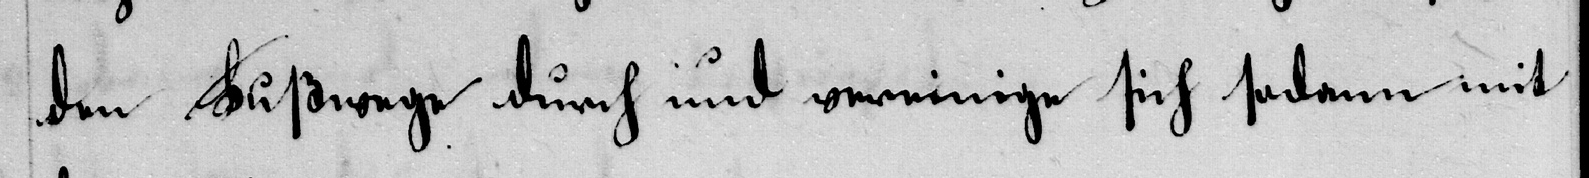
den Fußwege durch und vereinige sich sodann mit
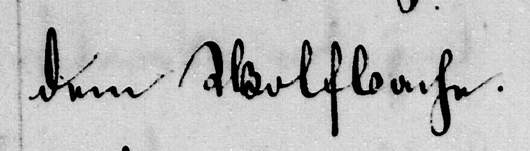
dem Wolfbache.
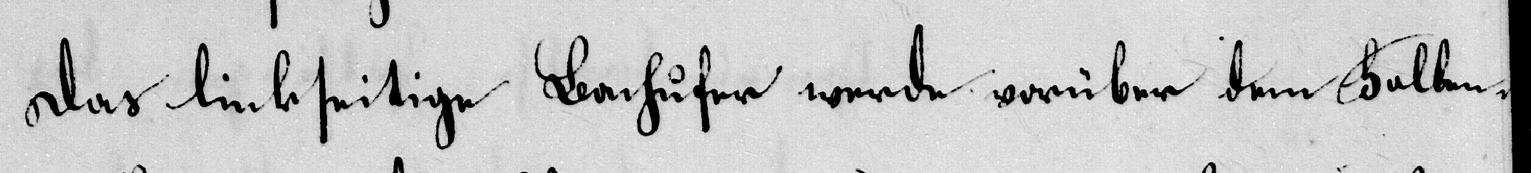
Das linkseitige Bachufer werde vorüber dem Follen¬
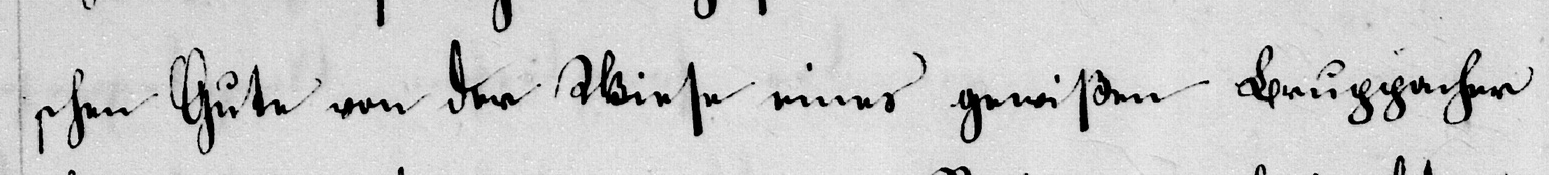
schen Gute von der Wiese eines gewißen Bruppacher
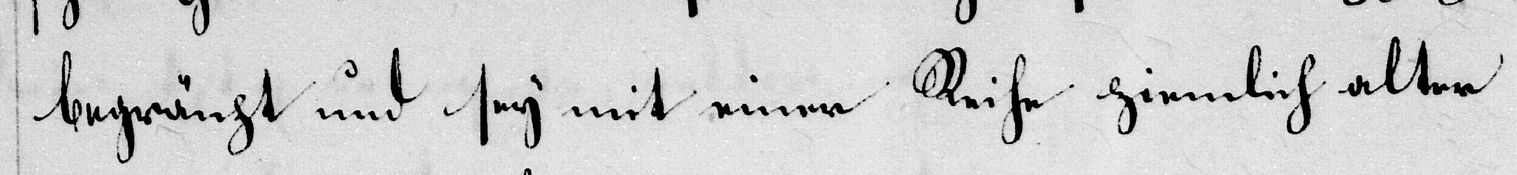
begränzt und sey mit einer Reihe ziemlich alter
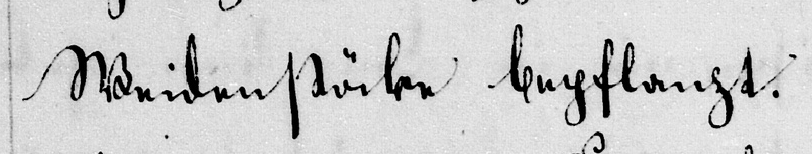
Weidenstöcke bepflanzt.
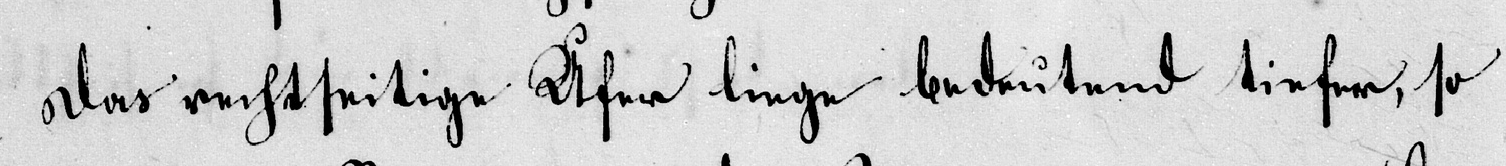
Das rechtseitige Ufer liege bedeutend tiefer, so
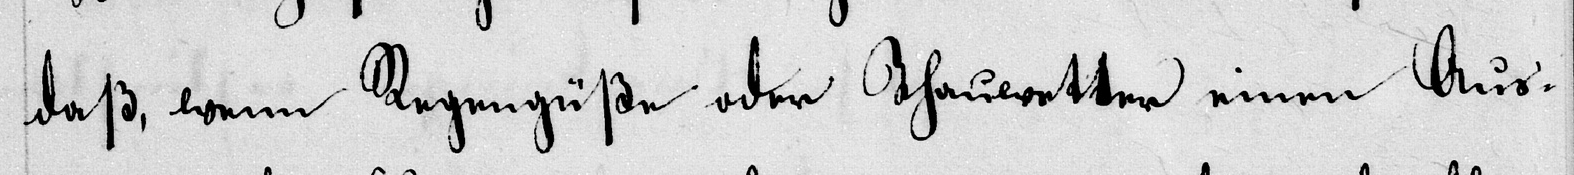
daß, wenn Regengüße oder Thauwetter einen Aus¬
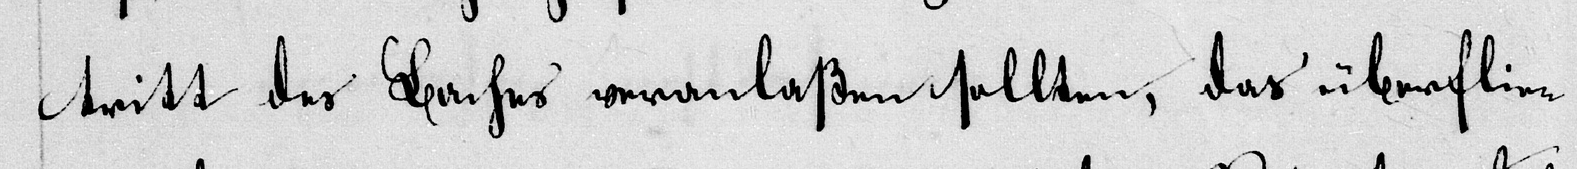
tritt des Baches veranlaßen sollten, das überflie¬
